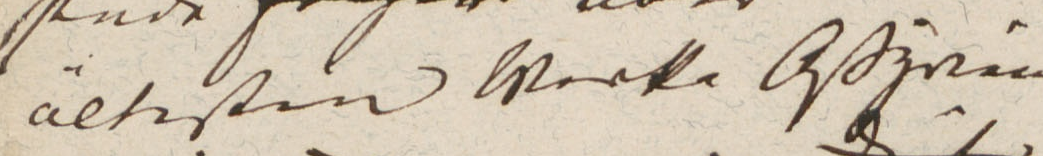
ältesten Werke Assyriens
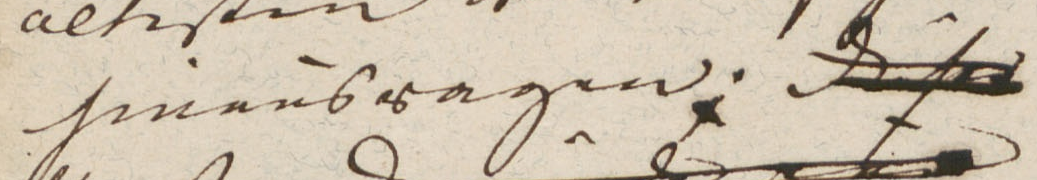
hinausragen;. Dieser
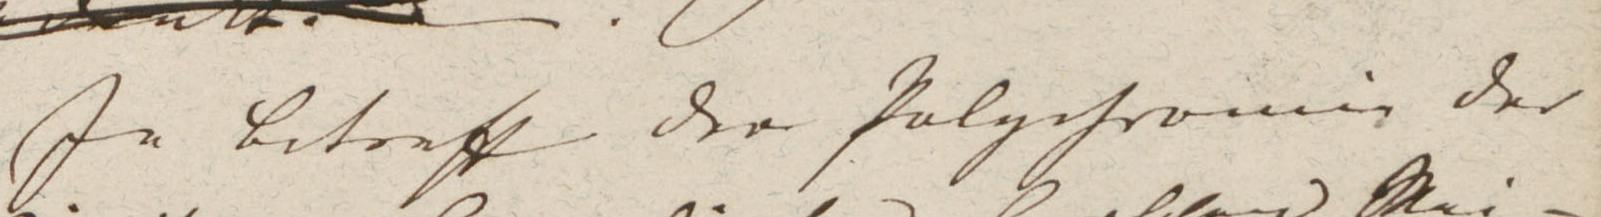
In Betreff der Polychromie der
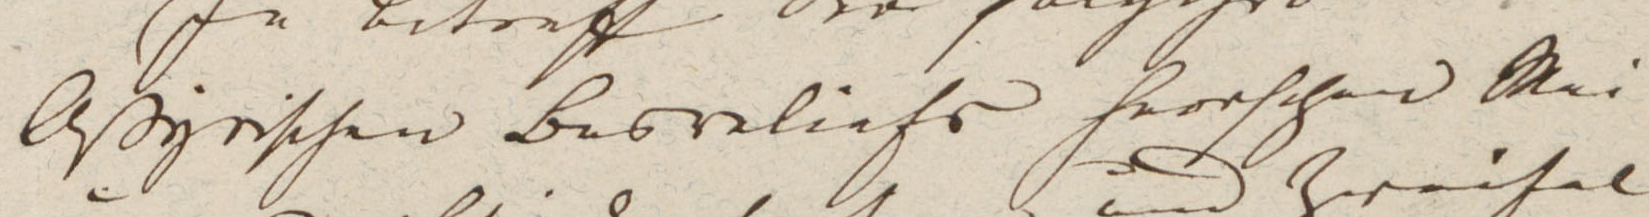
Assyrischen Basreliefs herrschen Mei-
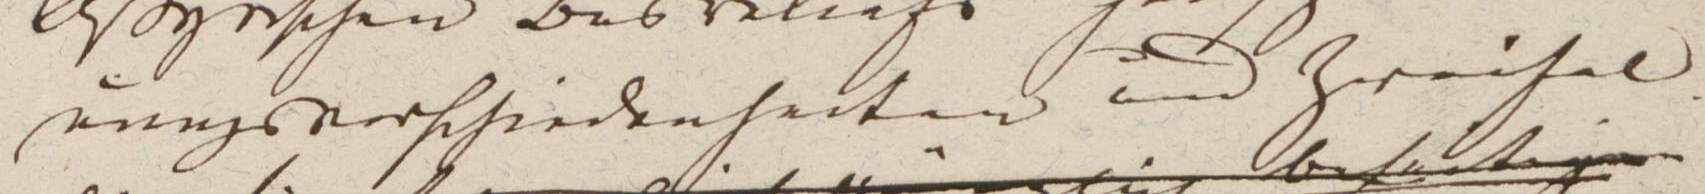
nungsverschiedenheiten und Zweifel
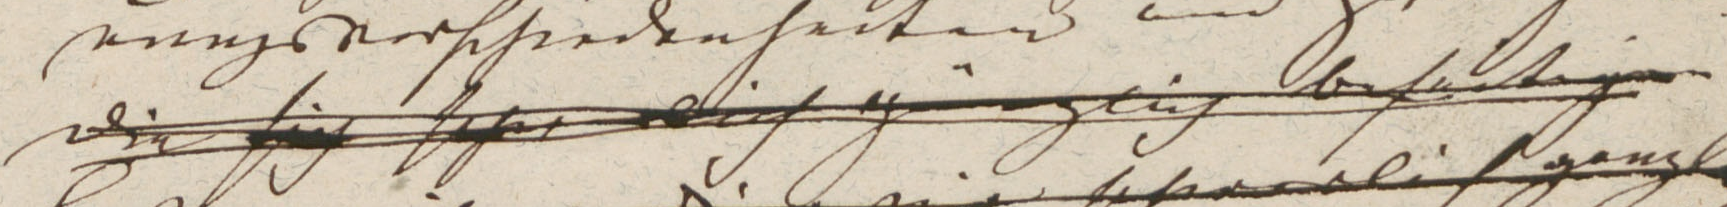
die sich schwerlich gänzlich beseitigen
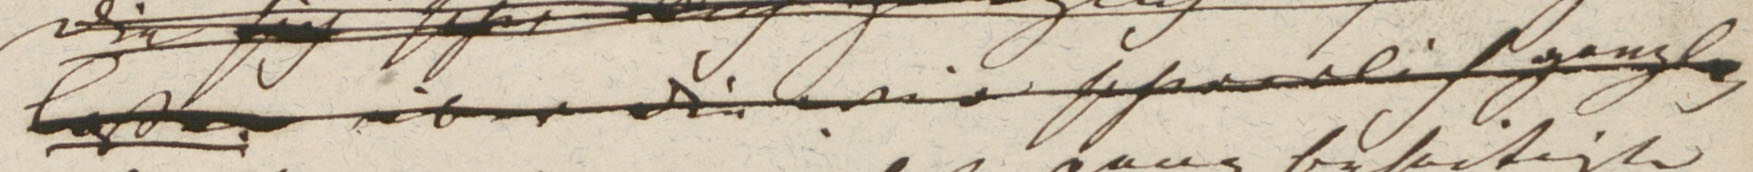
lassen über die wir schwerlich ganzlich
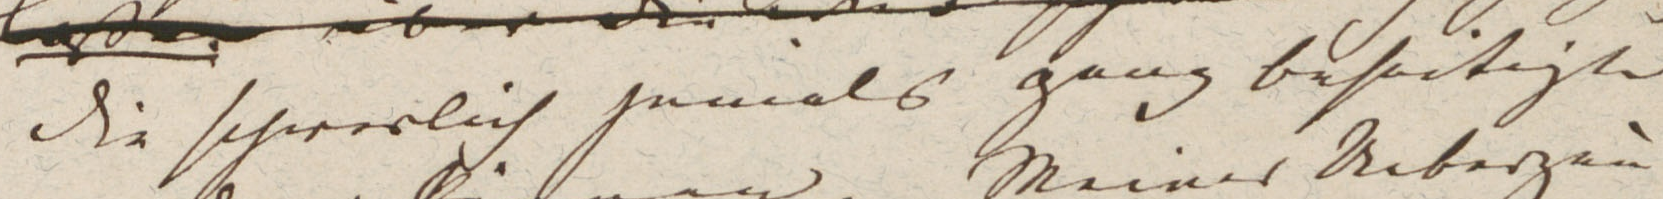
die schwerlich jemals ganz beseitigt
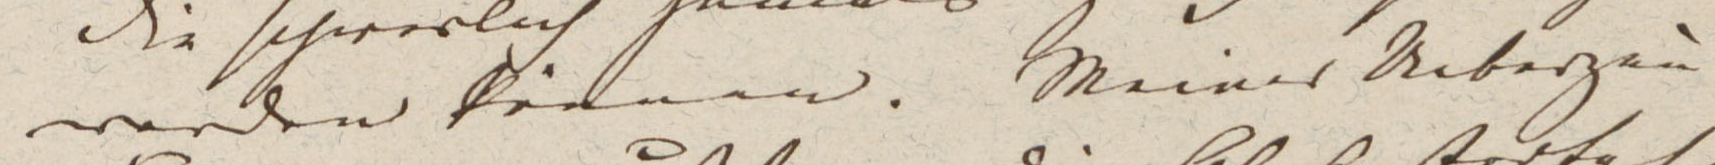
werden können. Meiner Ueberzeu-
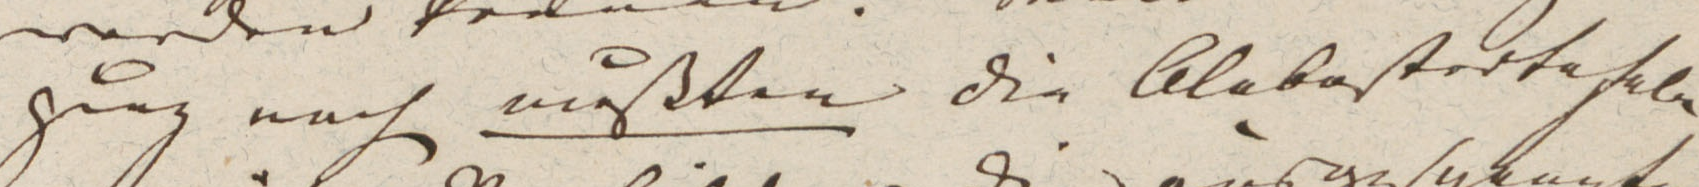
gung nach mussten die Alabastertafeln
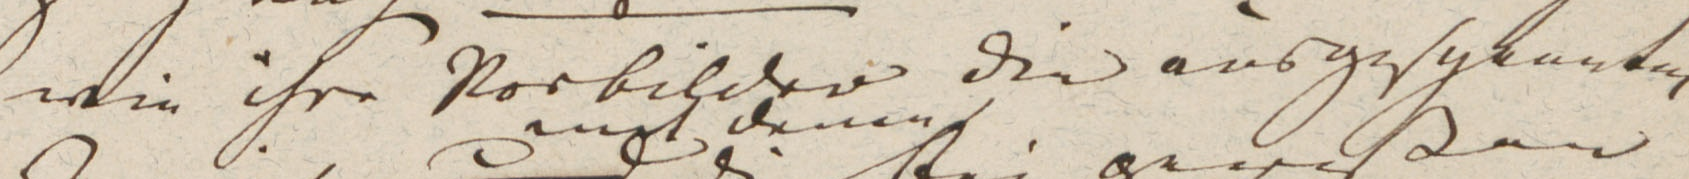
wie ihre Vorbilder die ausgespannten
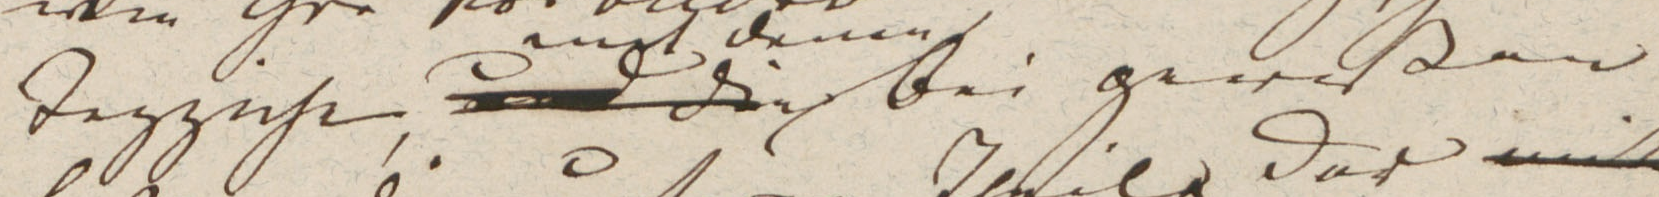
Teppiche, und die mit denen bei gewissen
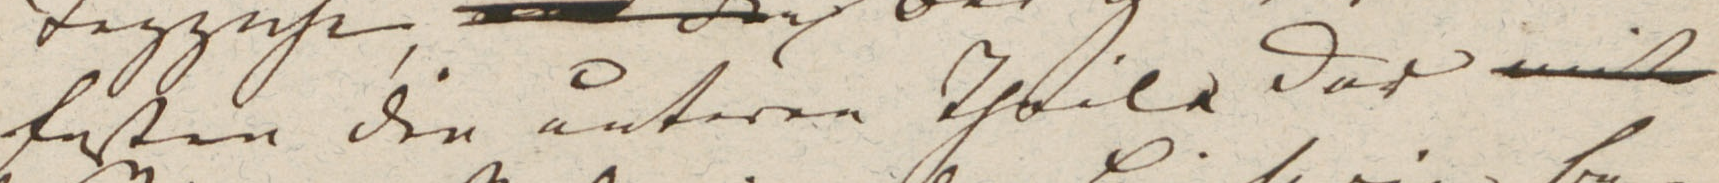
Festen die unteren Theile der mit
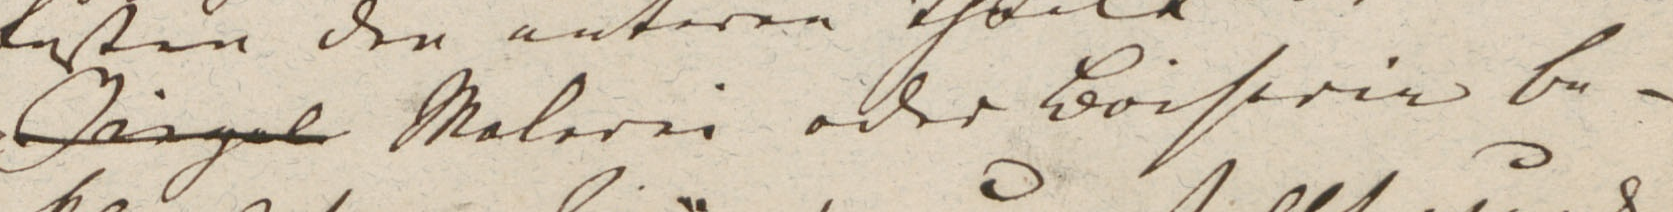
Ziegel Malerei oder Boiserie be-
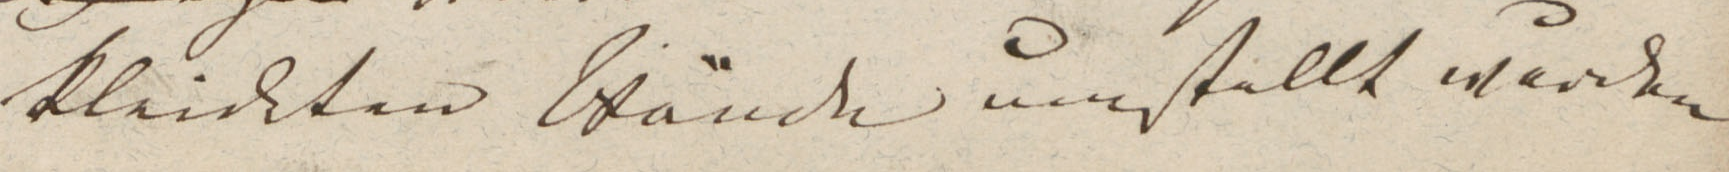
kleideten Wände umstellt wurden
